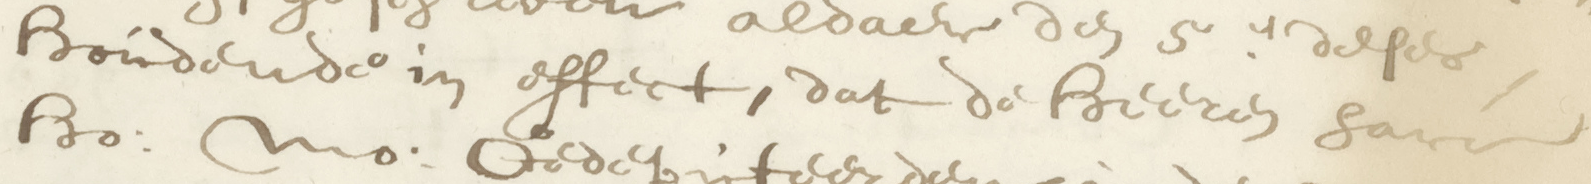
houdende in effect, dat de heeren hare
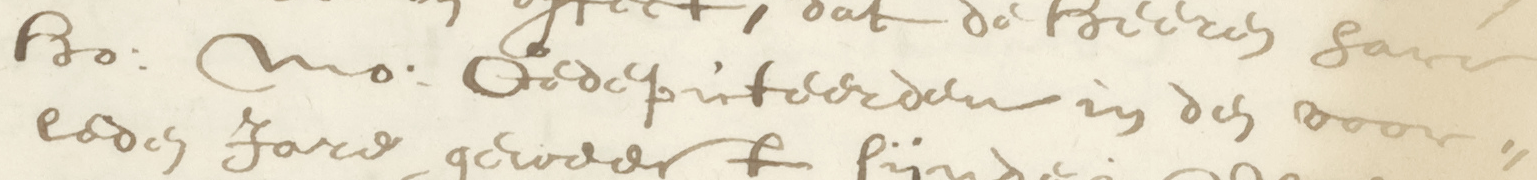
Ho:Mo: Gedeputeerden in den voor„
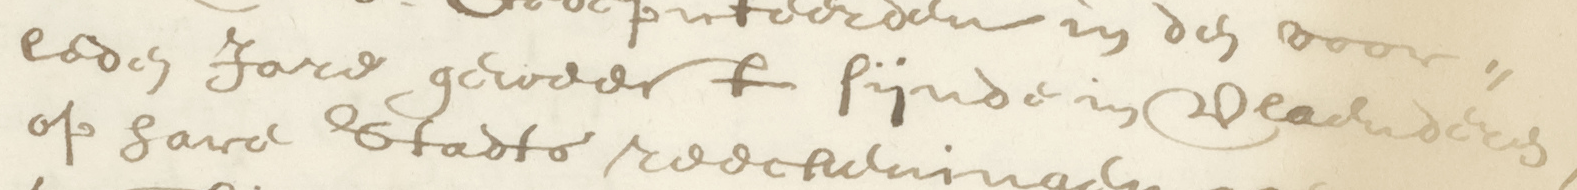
leden Jare geweest sijnde in Vlaenderen,
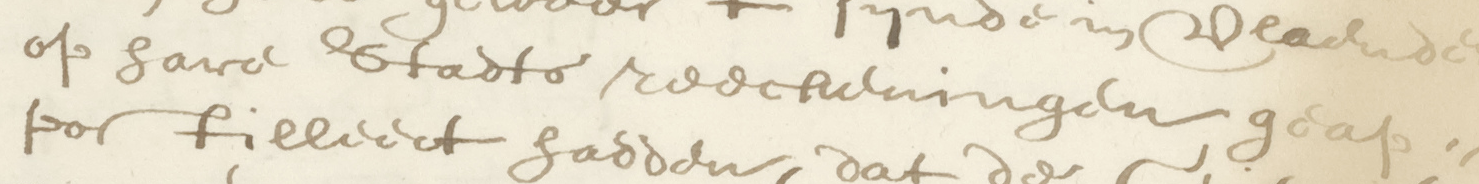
op hare Stadts reeckeningen geap„
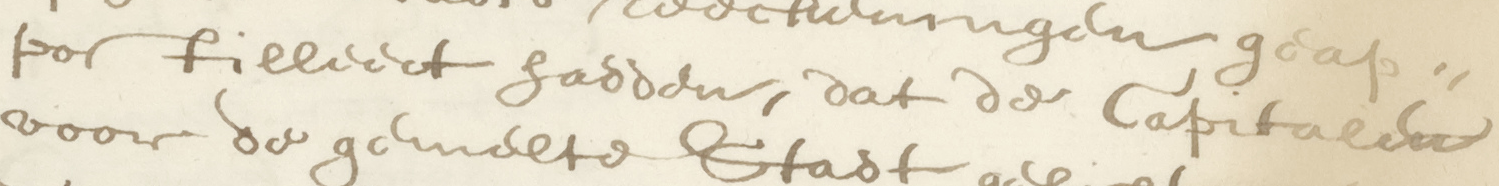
postilleert hadden, dat de Capitalen
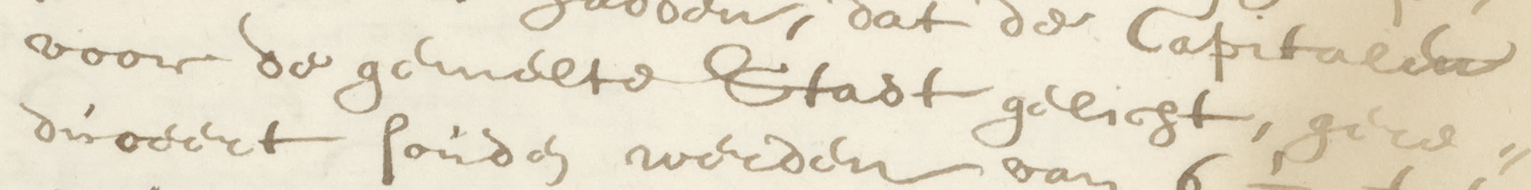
voor de gemelte Stadt gelicht, gere„
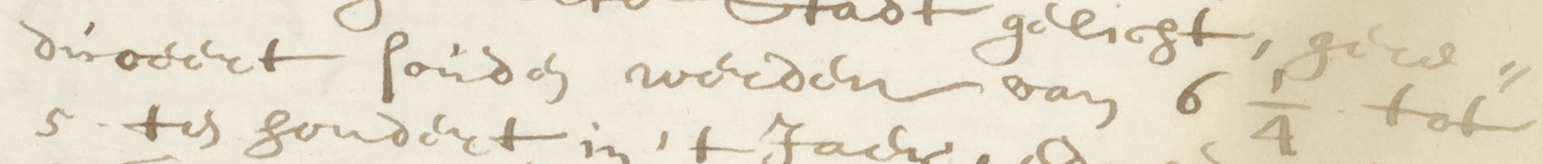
duceert souden werden van 6¼ tot
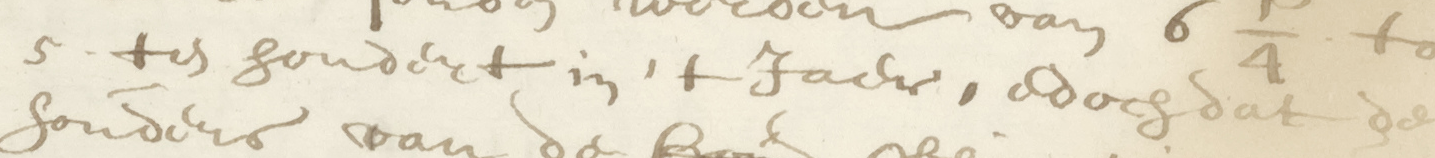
5. ten hondert in‛ t Jaer, edoch dat de
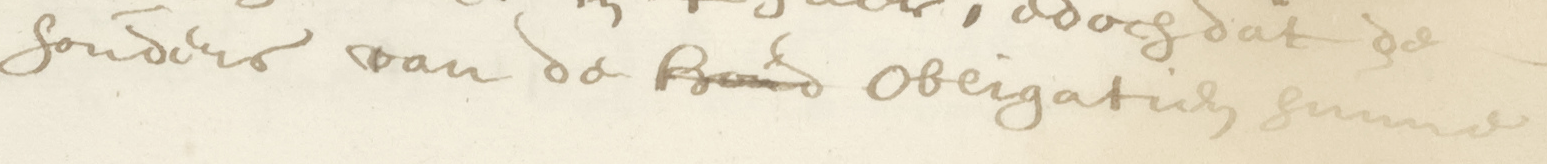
houders van de houd obligatien hunne
